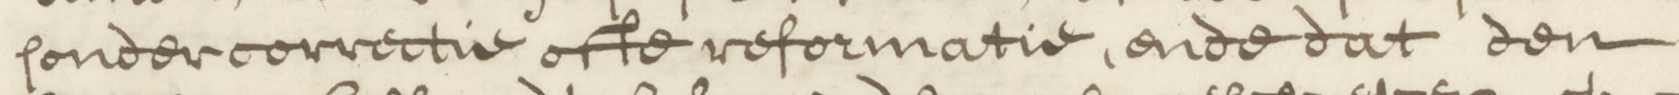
sonder correctie ofte reformatie, ende dat den
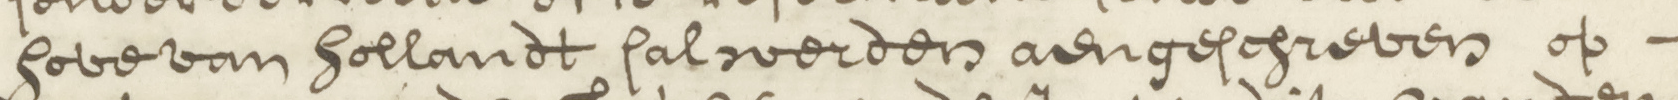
hove van hollandt sal werden aengeschreven, op ¬
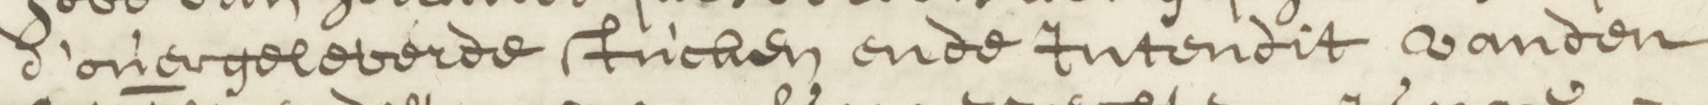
d'ouergeleverde stucken ende Intendit vanden
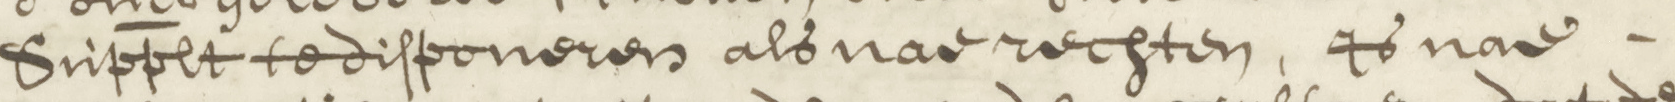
Supplt te disponeren als nae rechten. Is nae —
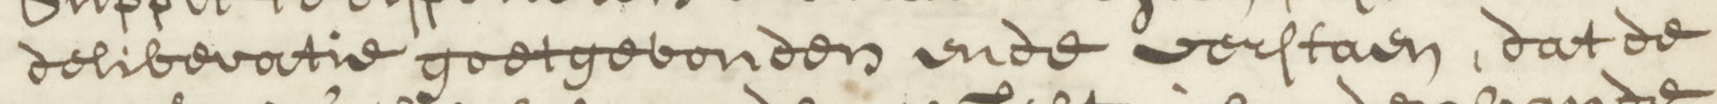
deliberatie goetgevonden ende verstaen, dat de
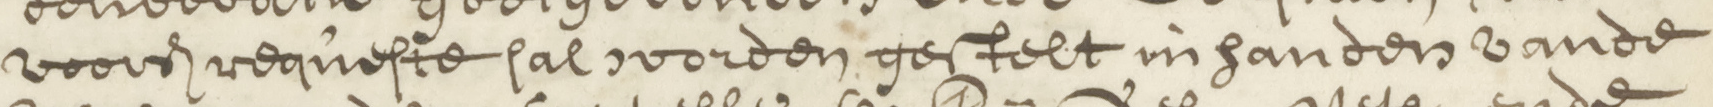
voors requeste sal worden gestelt in handen vande
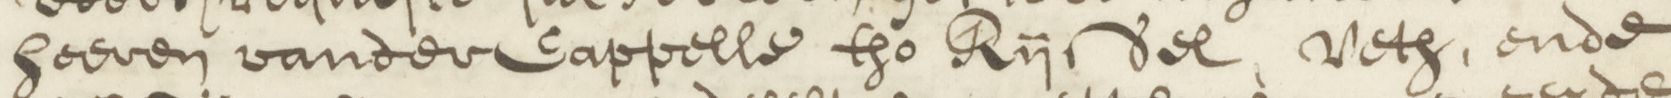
heeren vander Cappelle tho Rijssel, Veth, ende
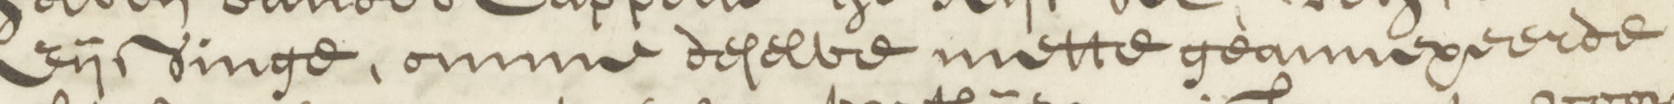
Eijssinge, omme deselve mette geannexeerde
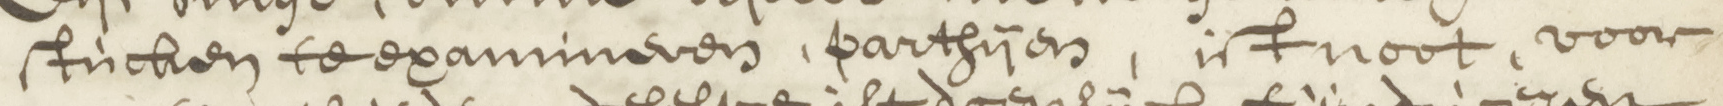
stucken te examineren, parthijen, ist noot, voor
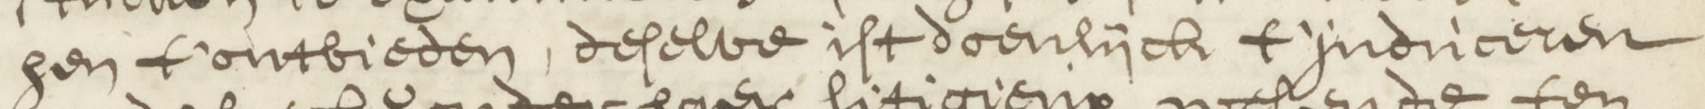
hen t'ontbieden, deselve ist doenlijck t'induceren
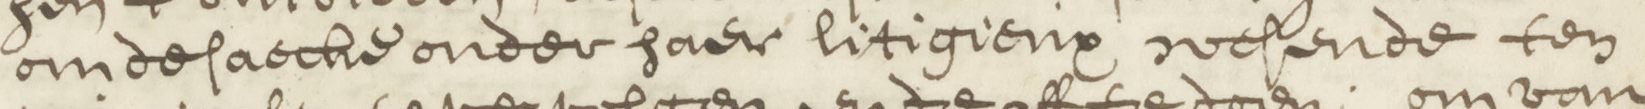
om de saecke onder haer litigieux wesende ten
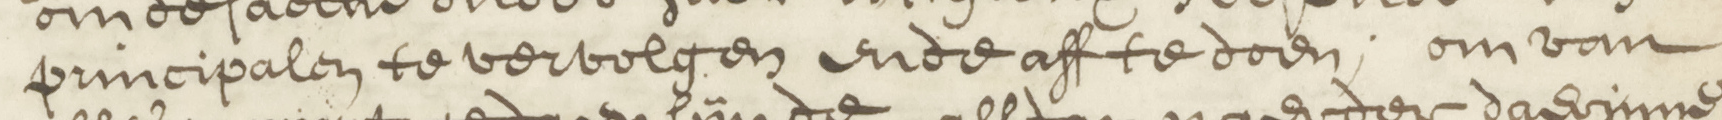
principalen te vervolgen ende aff te doen; om van
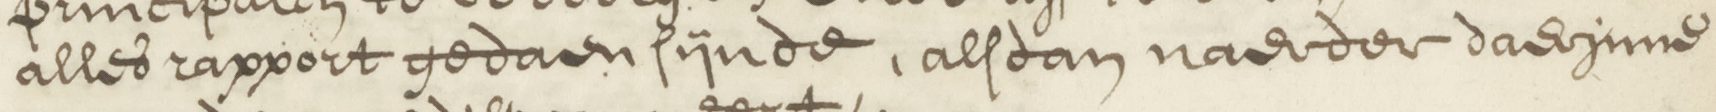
alles rapport gedaen sijnde, alsdan naerder daerinne
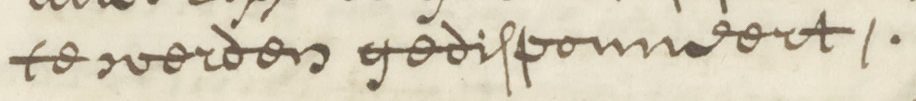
te werden gedisponneert.
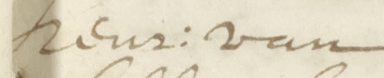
Henr: van
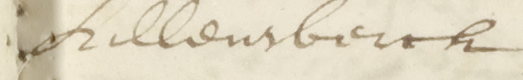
Hillensberch
